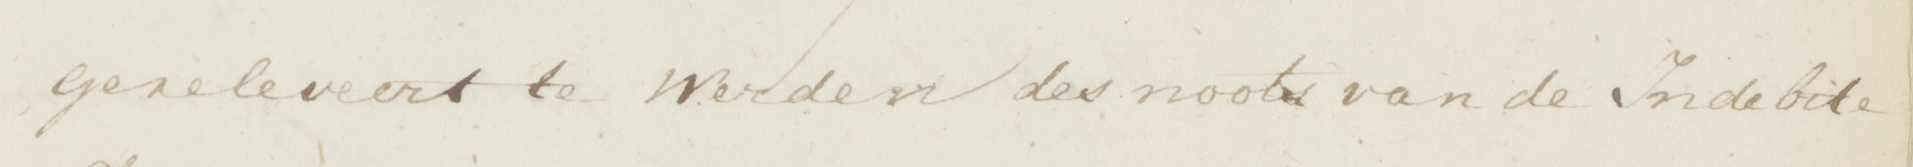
gereleveert te werden des noots van de Indebite
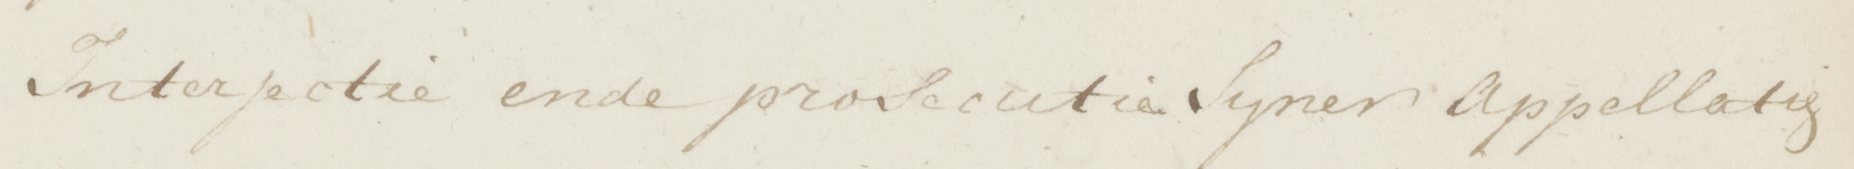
Interjectie ende prosecutie syner appellatie
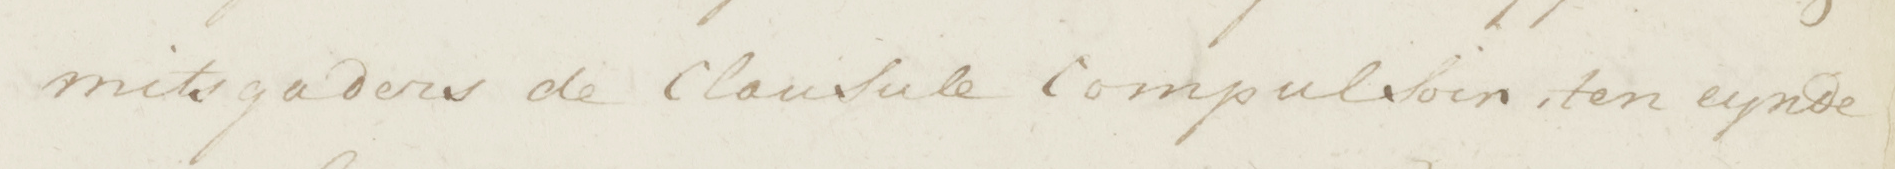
mitsgaders de clausule compulsoir, ten eynde
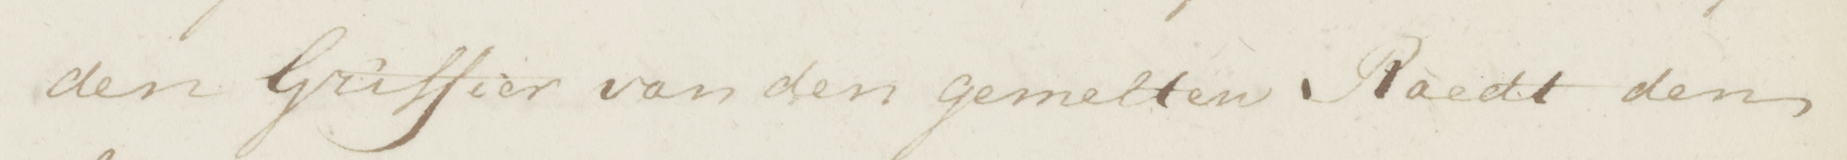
den Griffier van den gemelten Raedt den
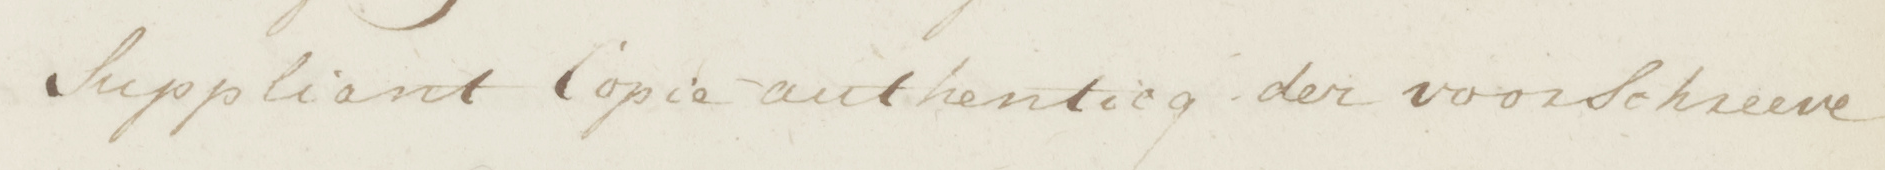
suppliant copie authenticq der voorschreeve
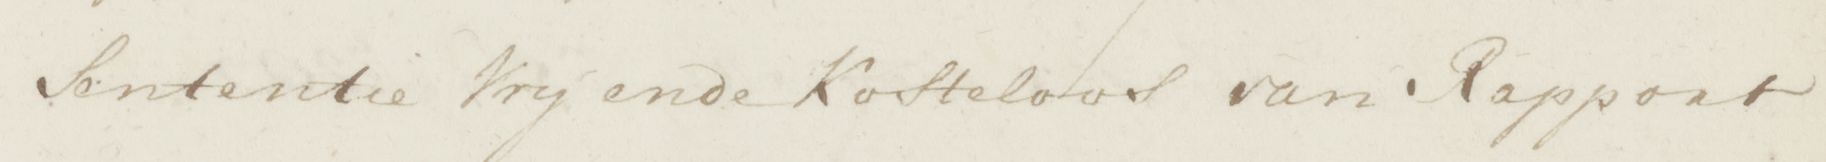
sententie vry ende Kosteloos van Rapport
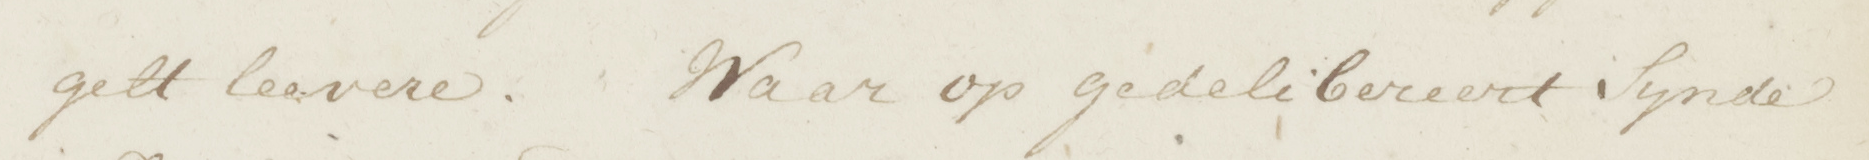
gelt leevere. Waar op gedelibereert synde
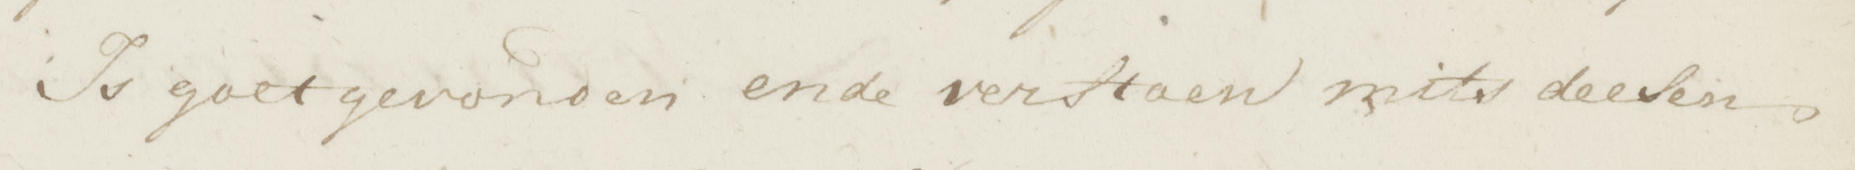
Is goetgevonden ende verstaen mits deesen
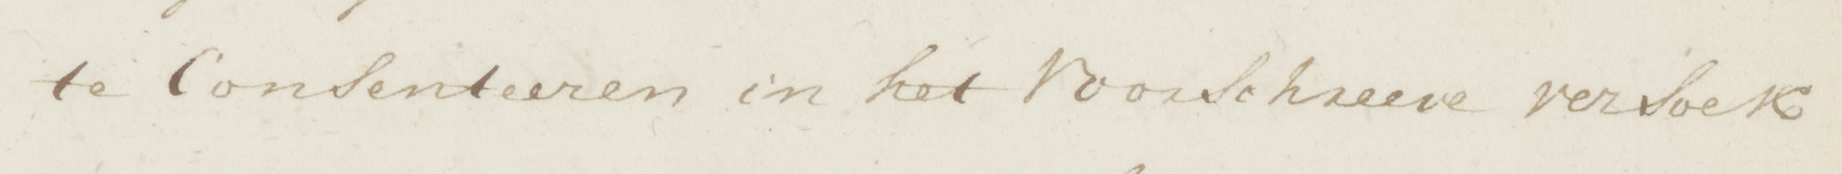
te consenteeren in het voorschreeve versoek
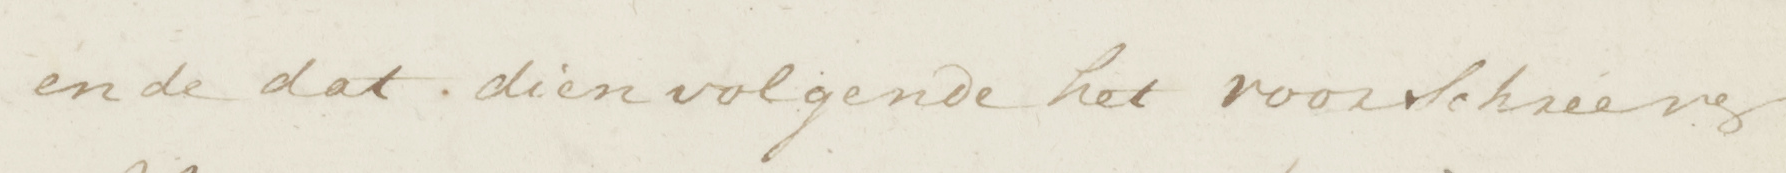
ende dat dien volgende het voorschreeve
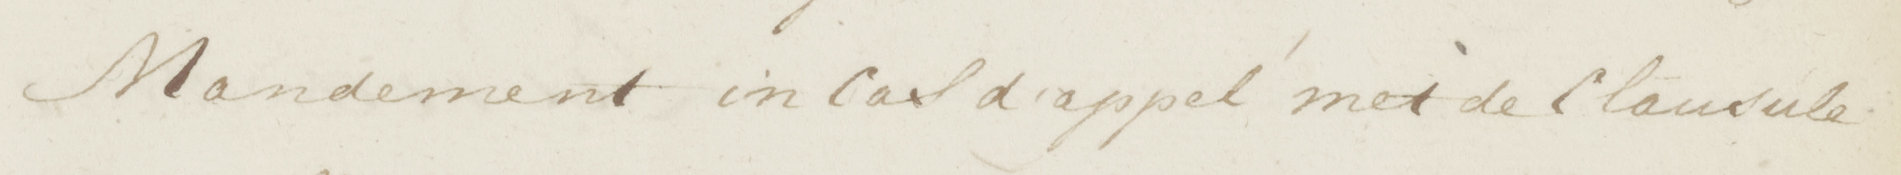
Mandement in cas d'appel met de clausule
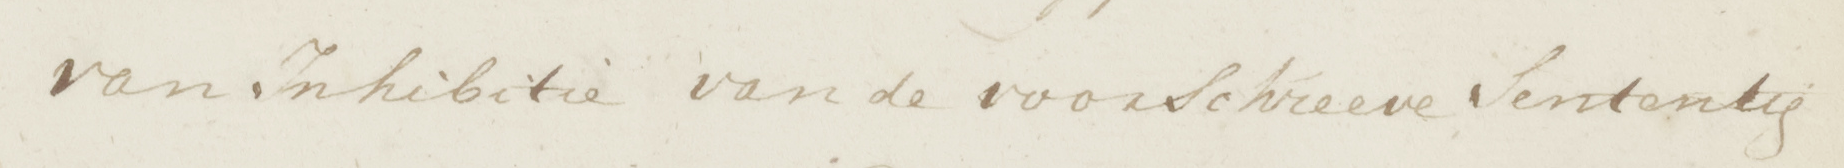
van Inhibitie van de voorschreeve sententie
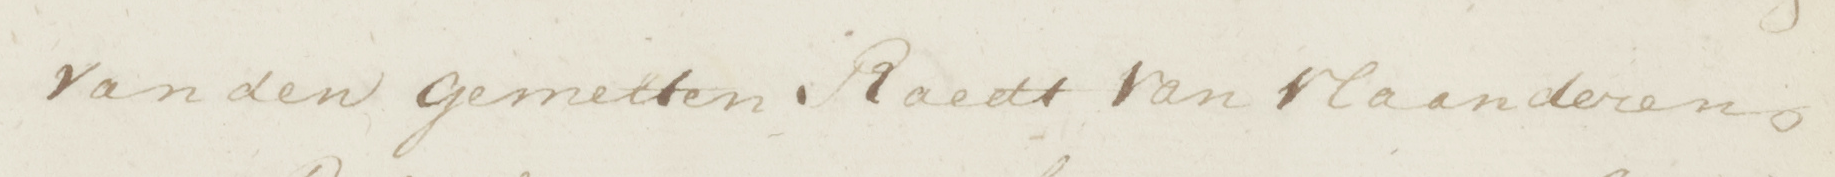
van den gemelten Raedt van Vlaanderen
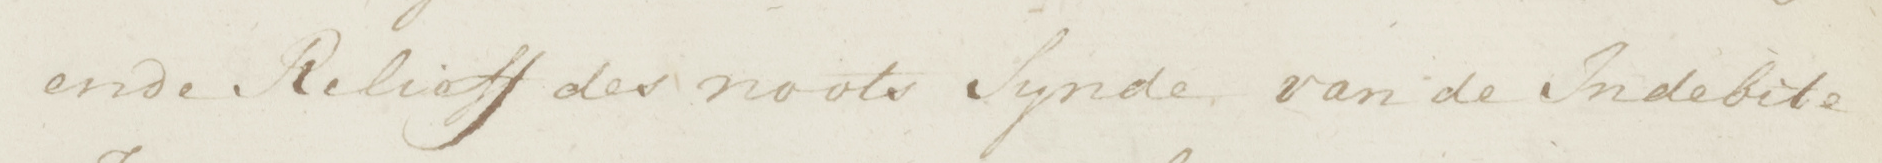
ende Relieff des noots synde van de Indebite
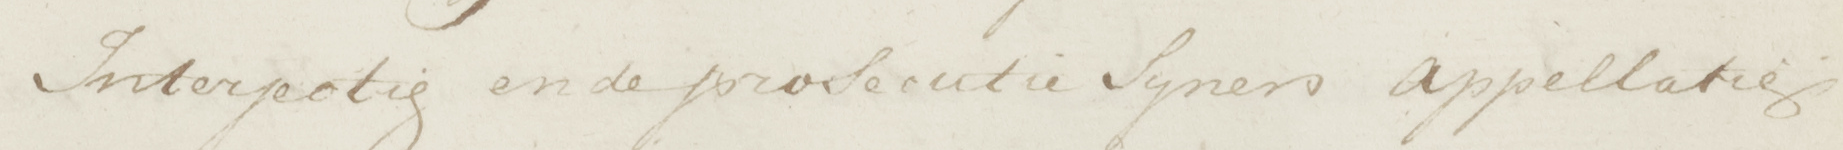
Interjectie en de prosecutie synen Appellatie
